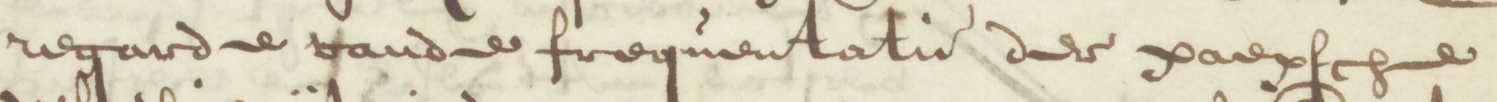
regarde vande frequentatie der paepsche
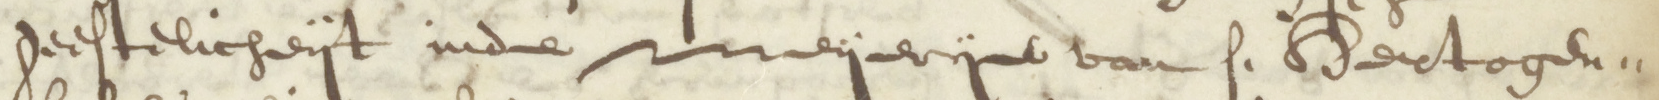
geestelicheijt inde Meijerije van s‛ Hertogen„
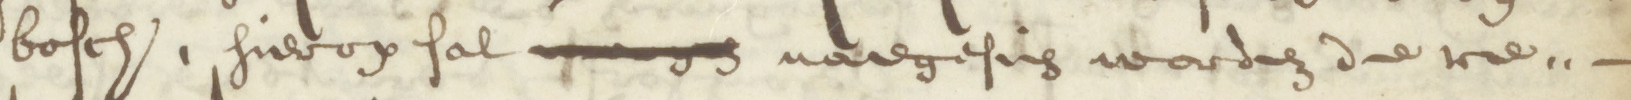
bosch, hierop sal egeen naegesien worden de re„
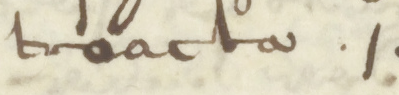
troacta.
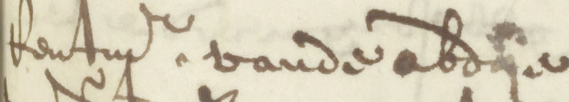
Rentmr. vande abdije
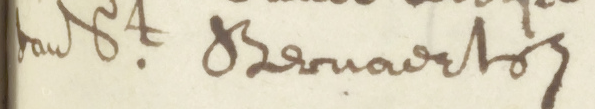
van St. Bernaertsz
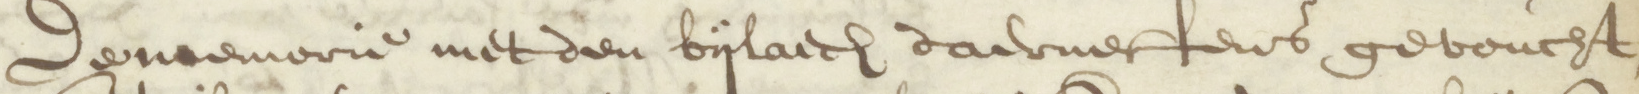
De memorie met den bijlaech, daerneffens gevoucht,
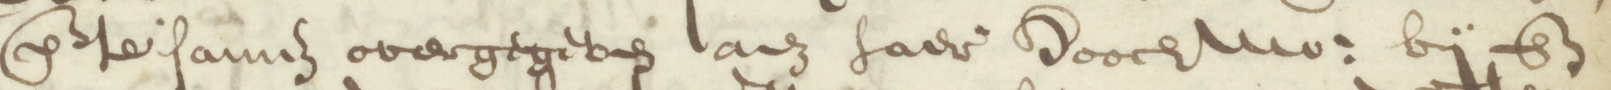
& te samen overgegeven aen haer HoochMo: bij &
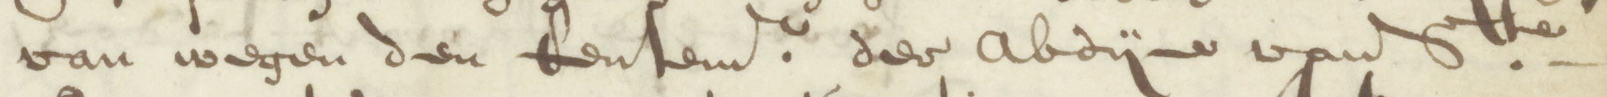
van wegen den Rentemr. der Abdije Ste.
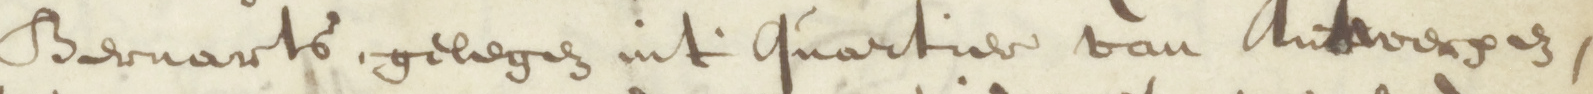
Bernarts, gelegen int' Quartier van Antwerpen,
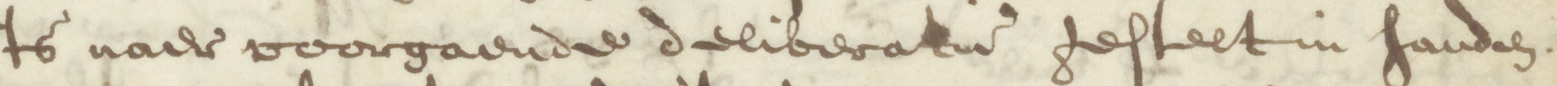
Is naer voorgaende deliberatie gestelt in handen
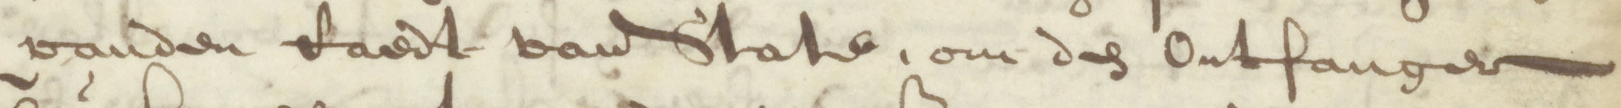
vanden Raedt van State, om den Ontfanger
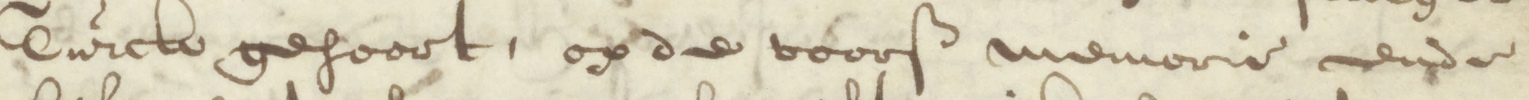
Turck gehoort, op de voors memorie ende
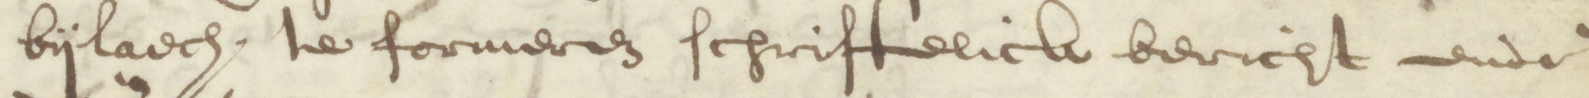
bijlaech, te formeren schriftelick bericht ende
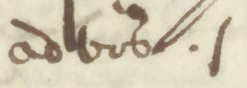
advis.
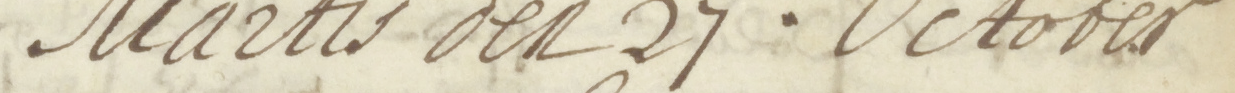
Martis den 27en. October
